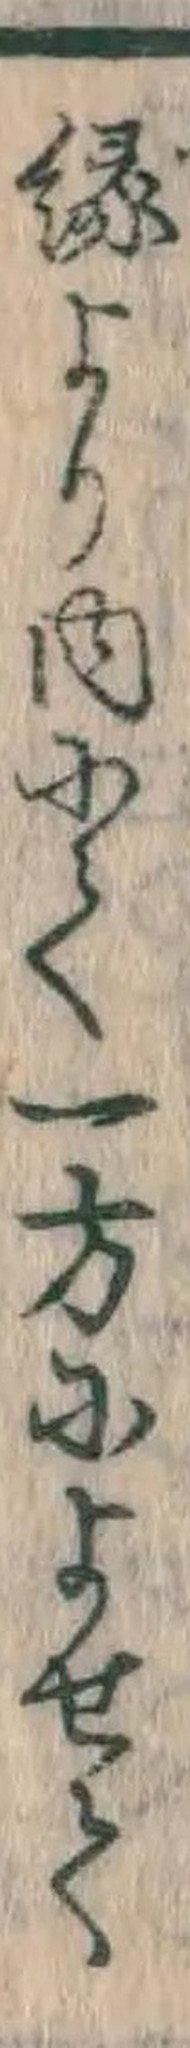縁より内にて一方によせて
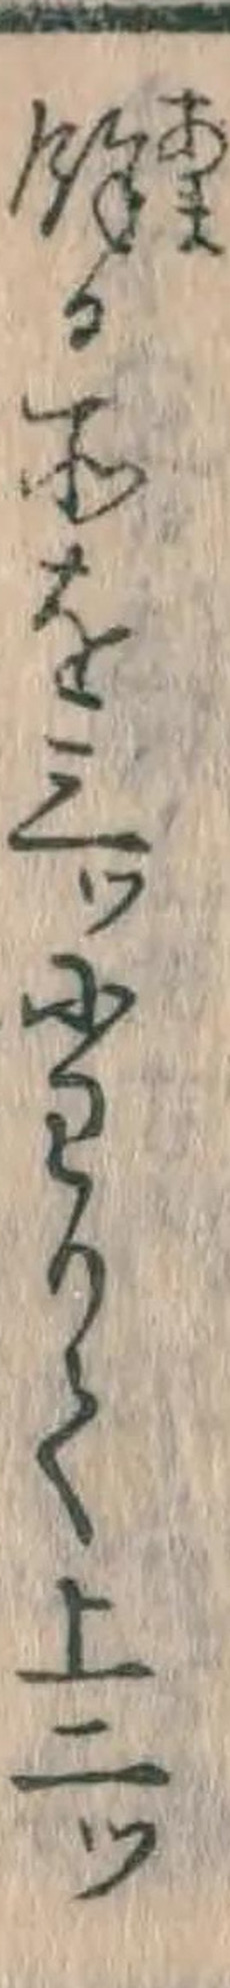余る所を三ッにわりて上二ッ
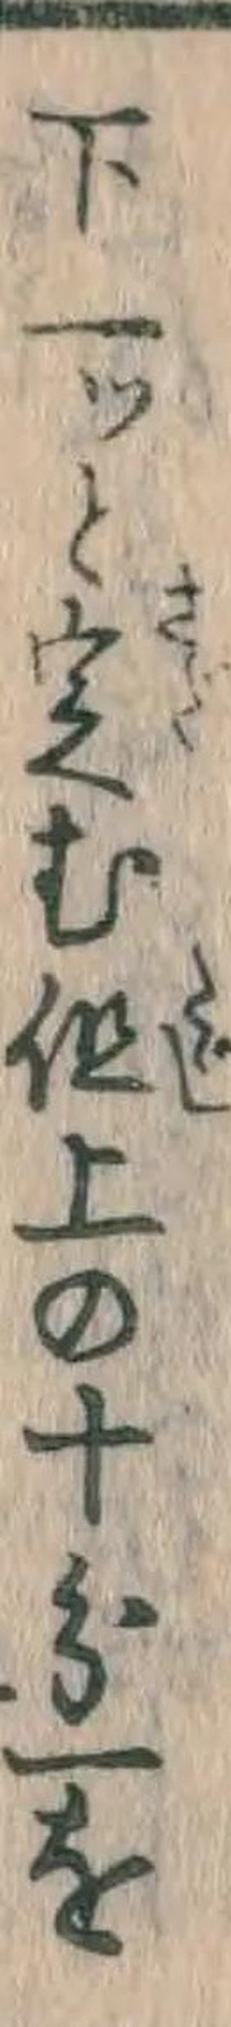下一ッと定む但上の十分一を
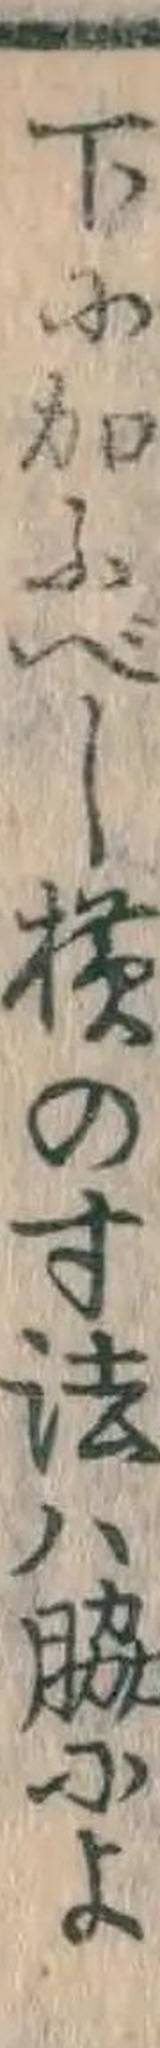下に加ふべし横の寸法は脇によ
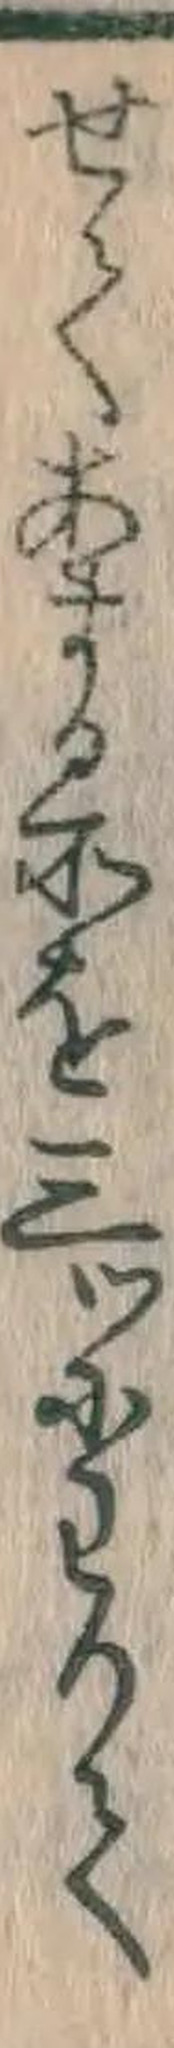せてあまる所を三ッにわりて
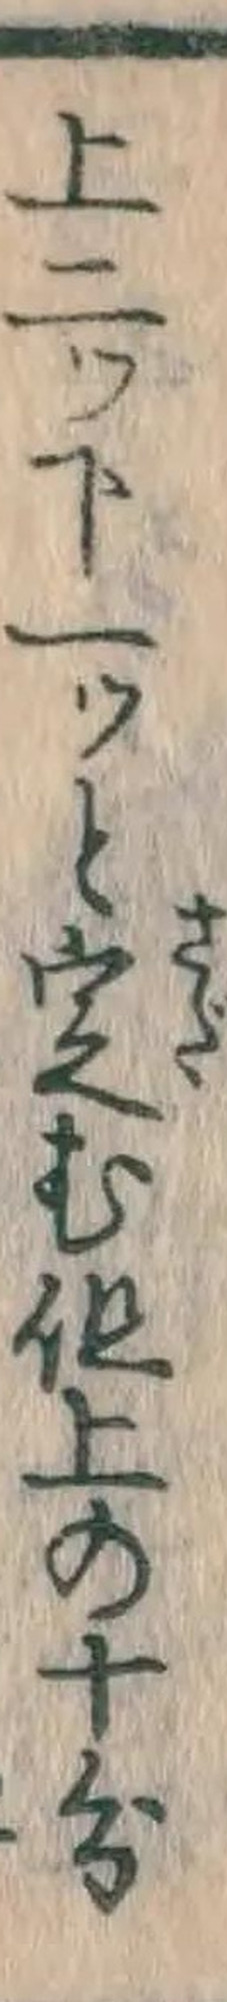上二ッ下一右ッと定む但上の十分
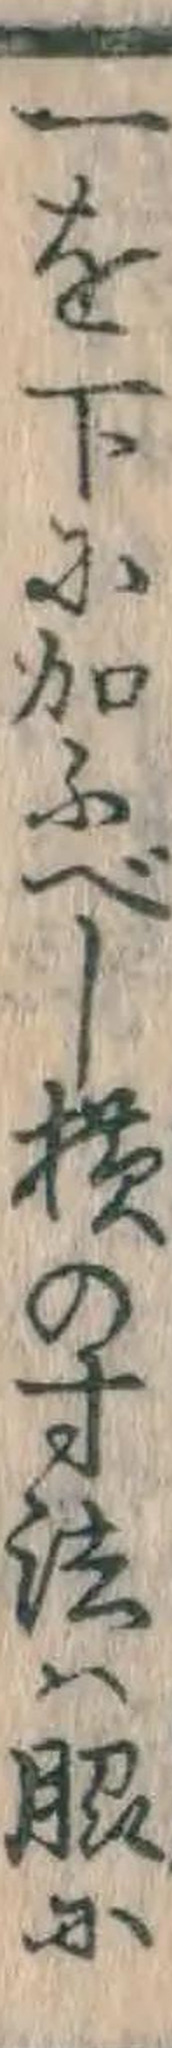一を下に加ふべし横の寸法は脇に
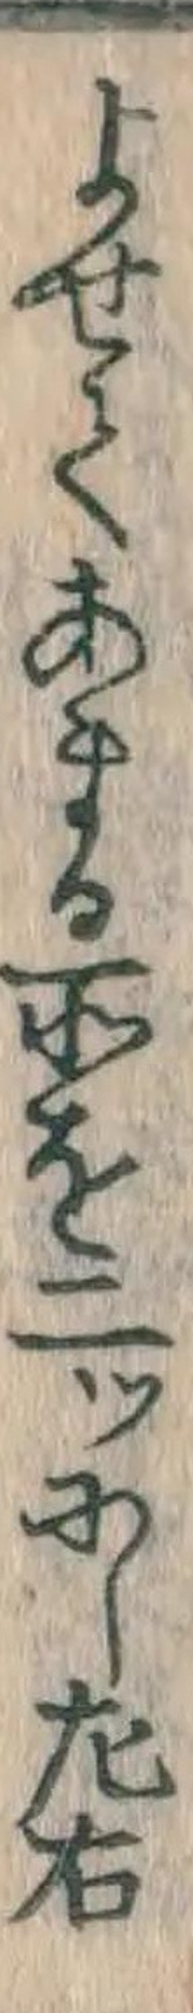よせてあまる所を二ッにし左右
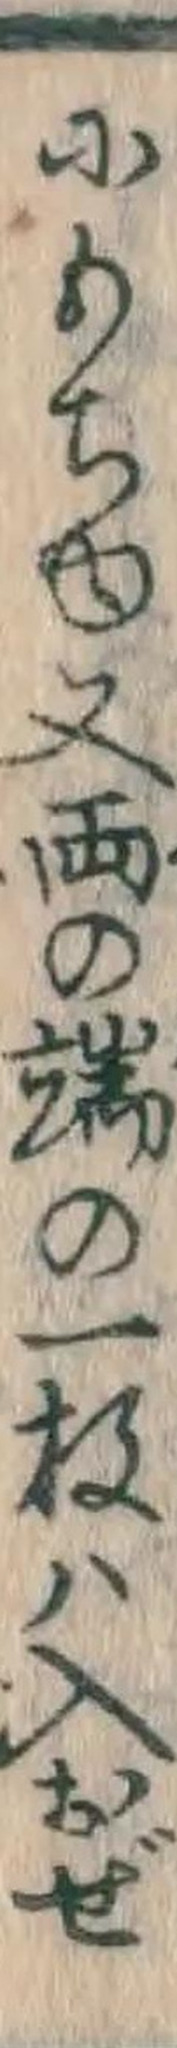にもちゆ又両の端の一枚は入おぜ
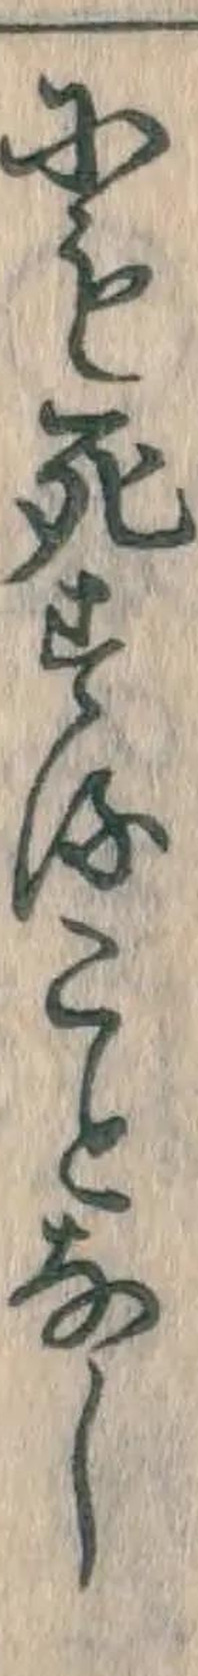にも死することなし
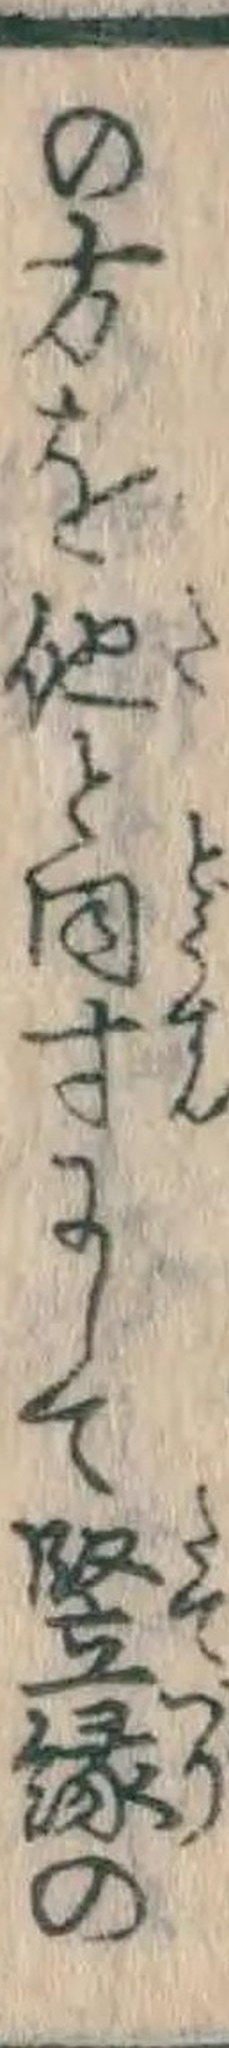の方を他と同寸にして竪縁の
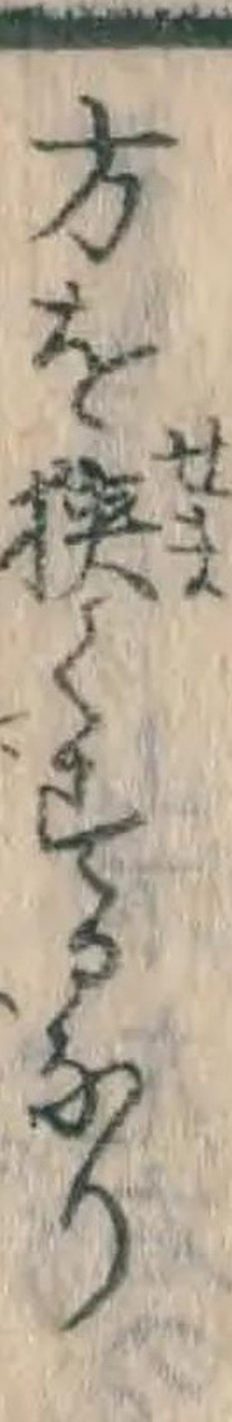方を狭くするなり
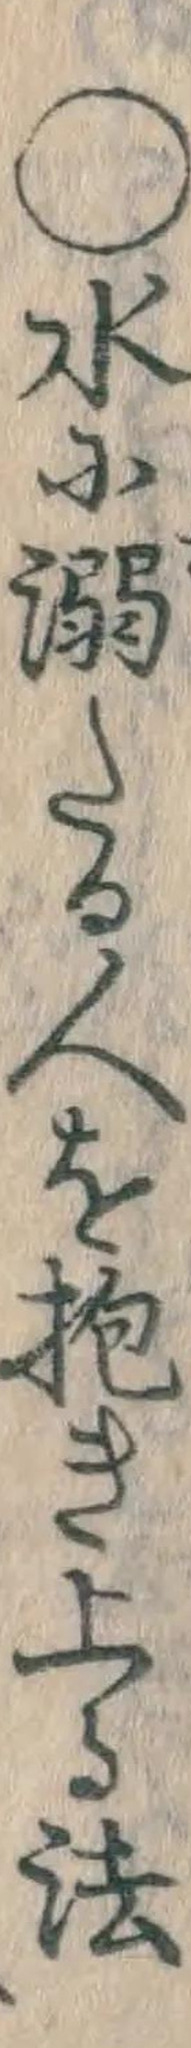○水に溺たる人を抱き上る法
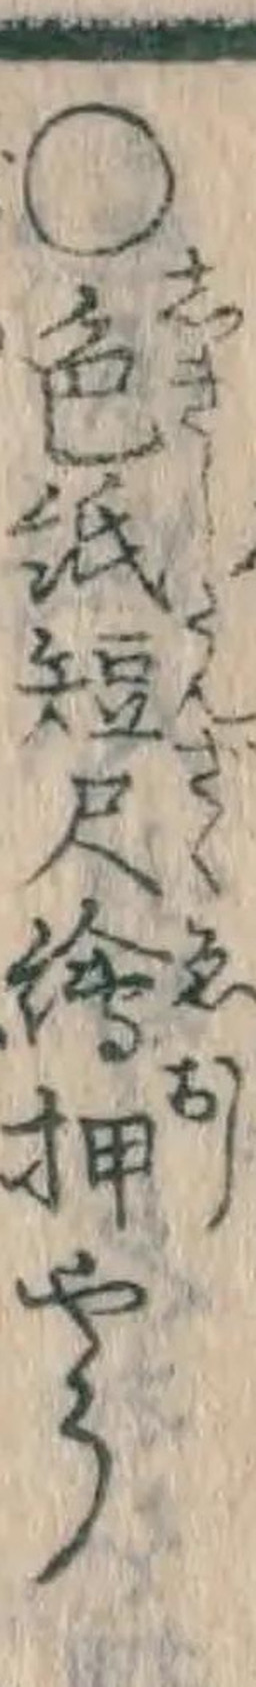○色紙短尺絵押やう
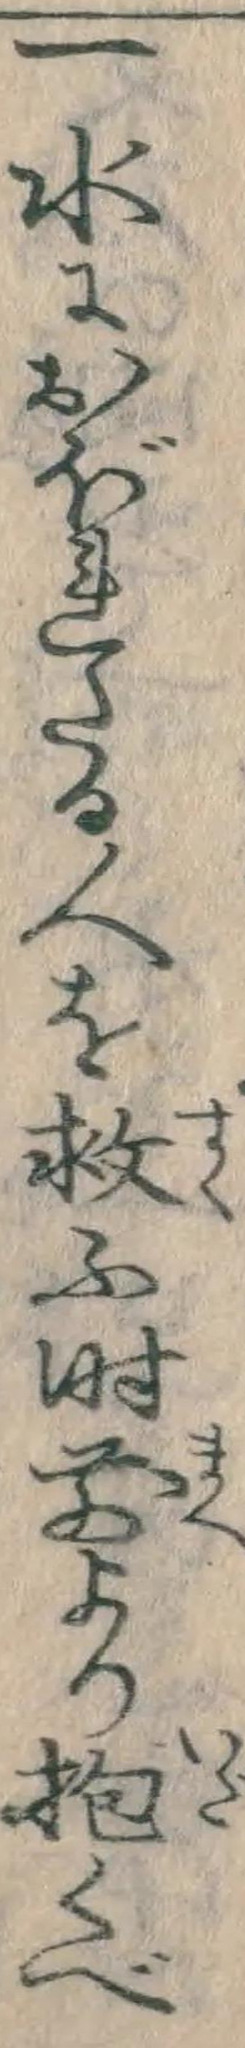一水におぼれたる人を救ふ時前より抱くべ
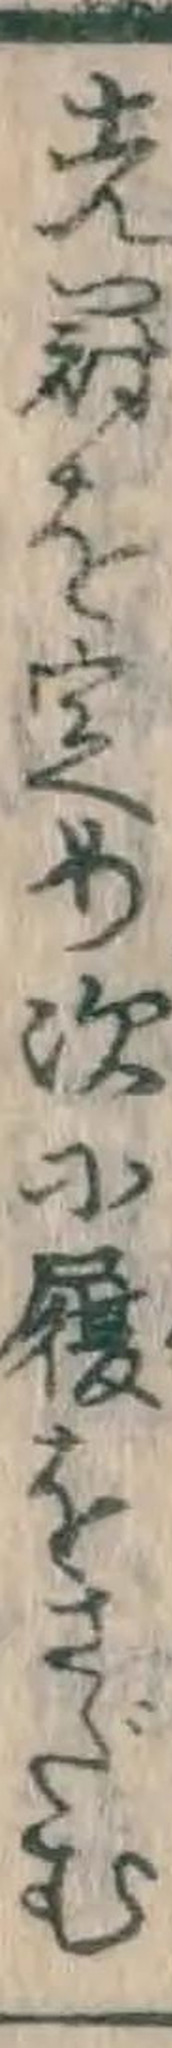先冠を定め次に履をさだむ
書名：広益秘事大全 3巻. [2]
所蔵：国立国会図書館 National Diet Library, JAPAN
